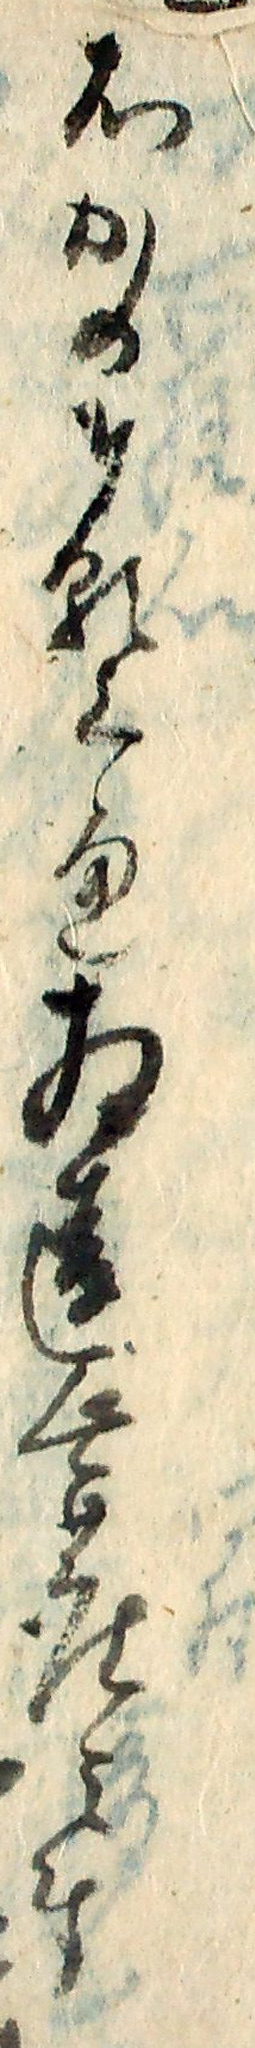右かの奉願上通相違無御座候に付
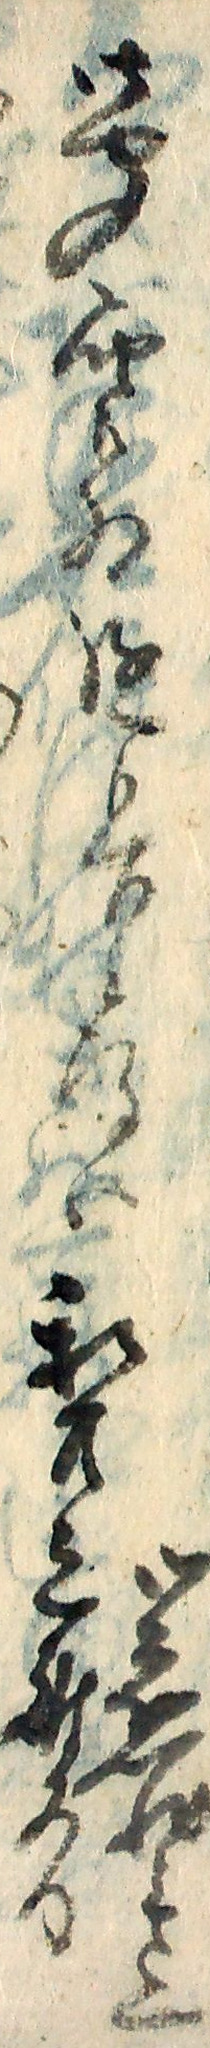御聞届被為遊被下候得は私共迄難有
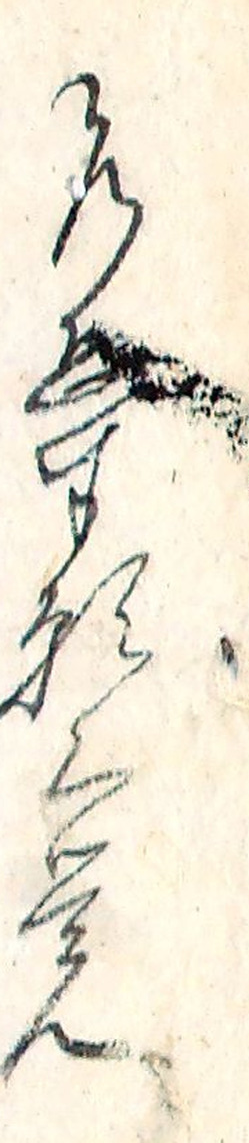乍恐奉願上覚

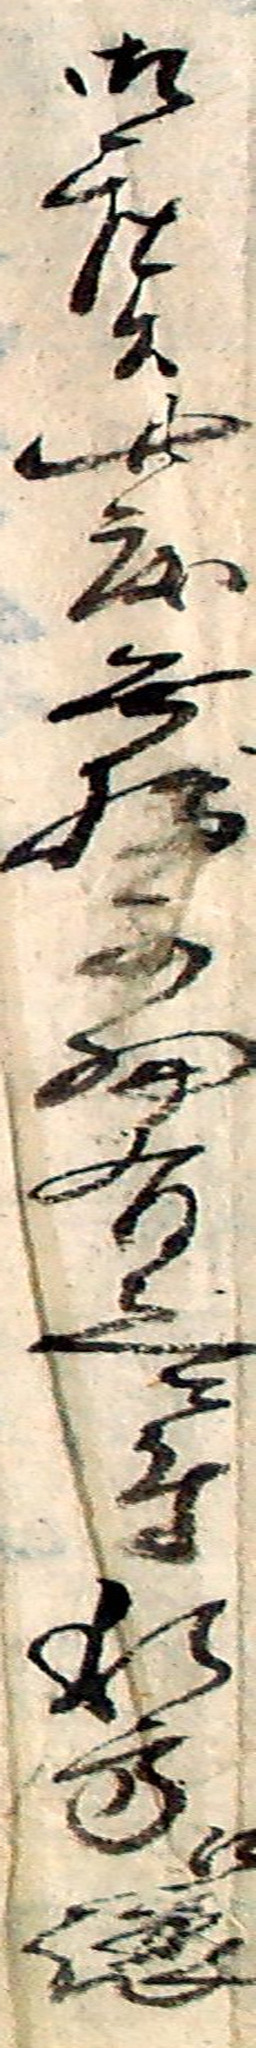御座候此度無拠子細有之に付私方え譲
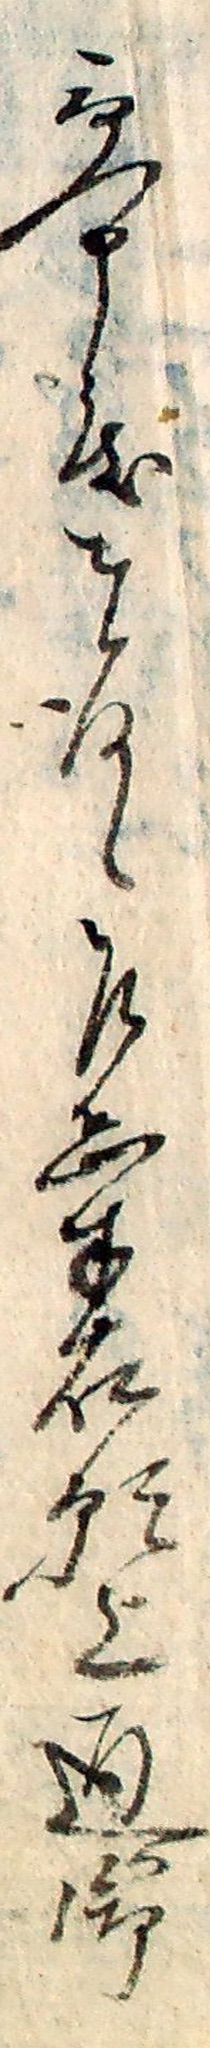受申度奉存候乍恐奉右願上通り御
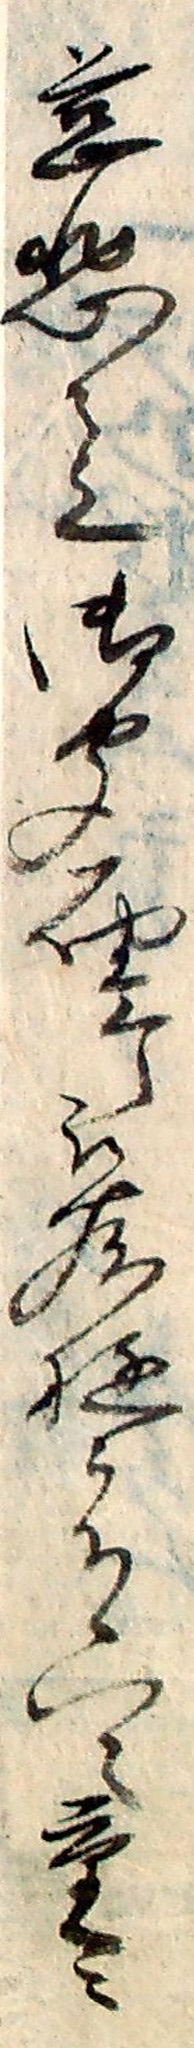慈悲之上御聞届け被為遊被下候はゝ重々
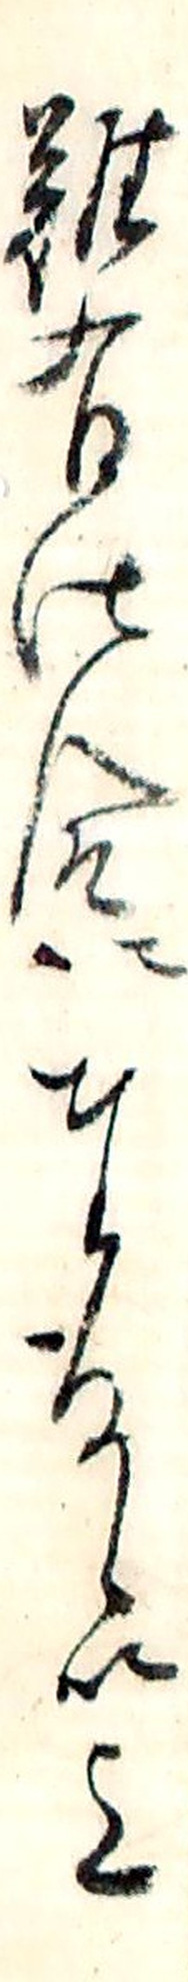難有仕合に奉存候以上
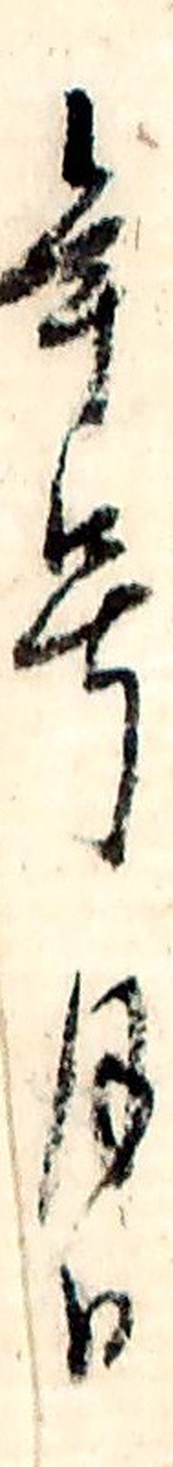年号月日
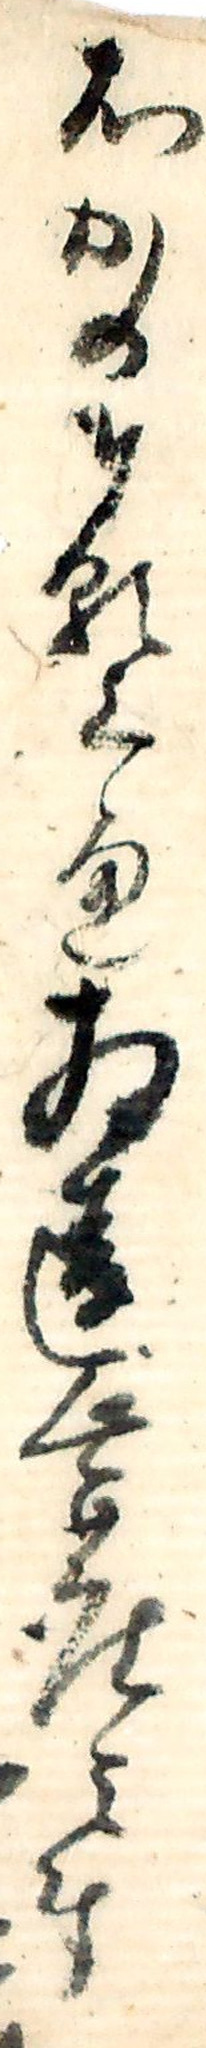右かの奉願上通相違無御座候に付
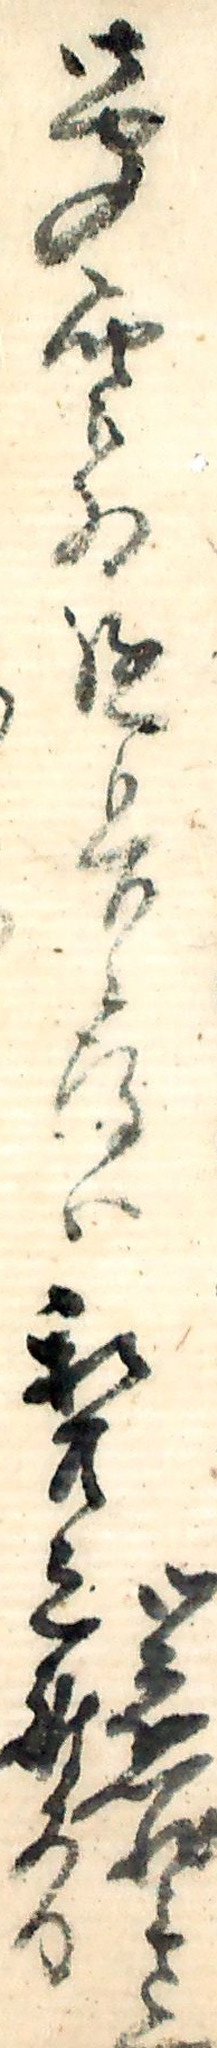御聞届被為遊被下候得は私共迄難有
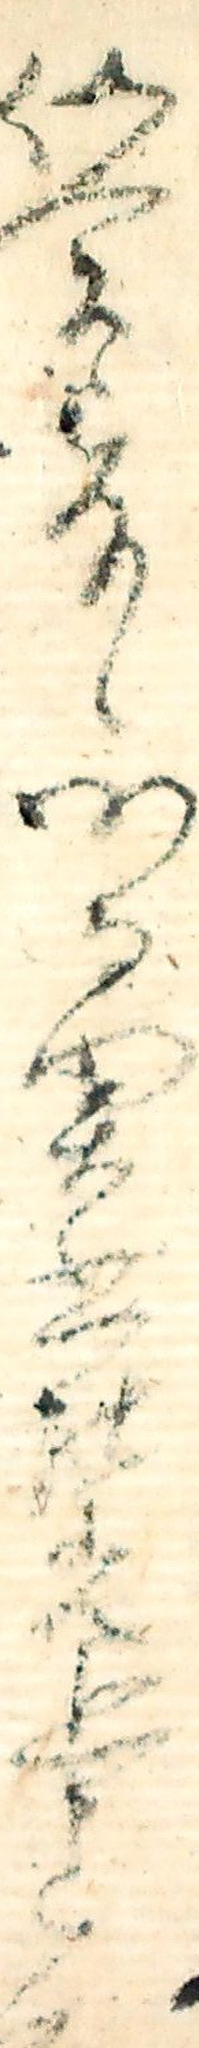仕合奉存候仍て奥書仕差上申候以上
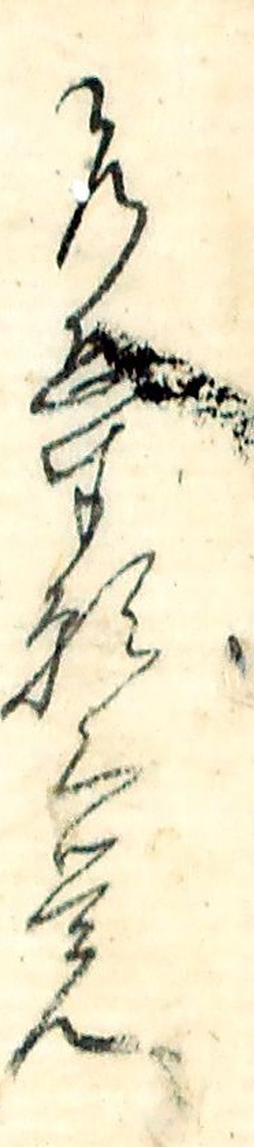乍恐奉願上覚
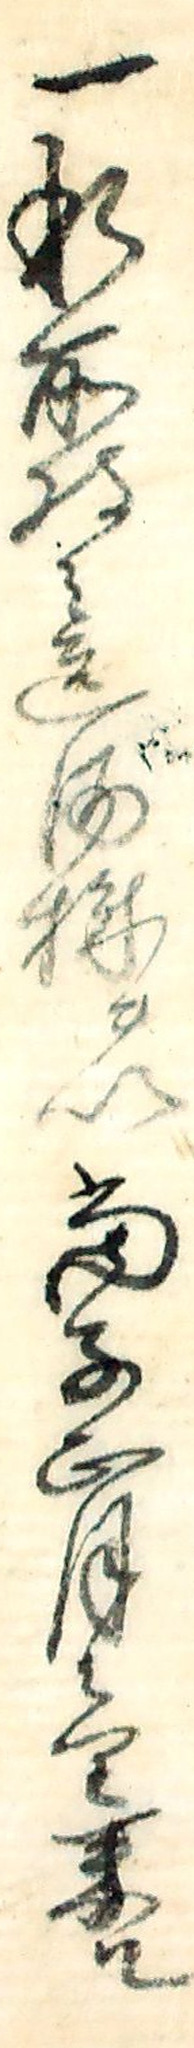一私所持之造酒株を以当子正月より来る
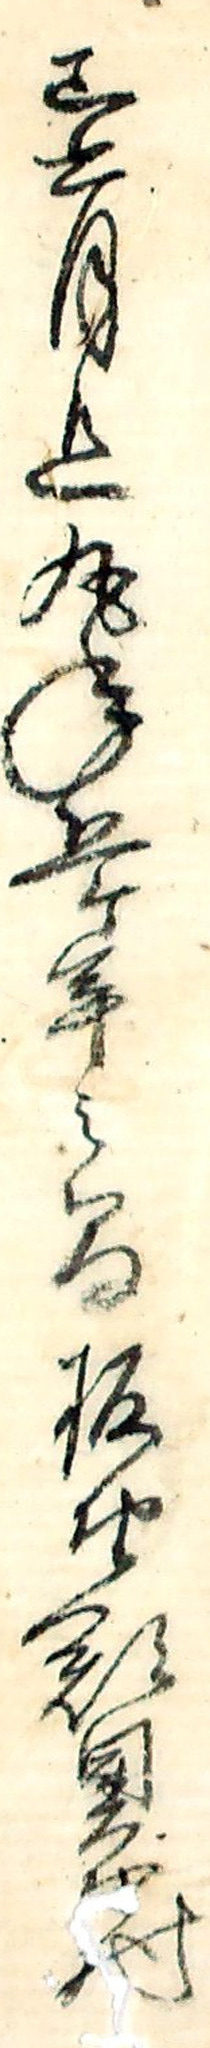巳六月迄丸年五ヶ年之間板野郡奥野村
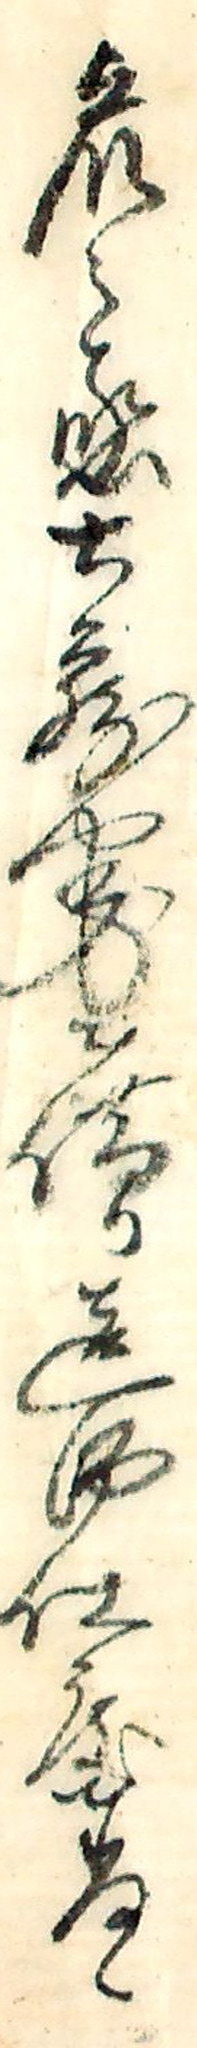虎之丞土蔵竈を借り造酒仕度奉存候
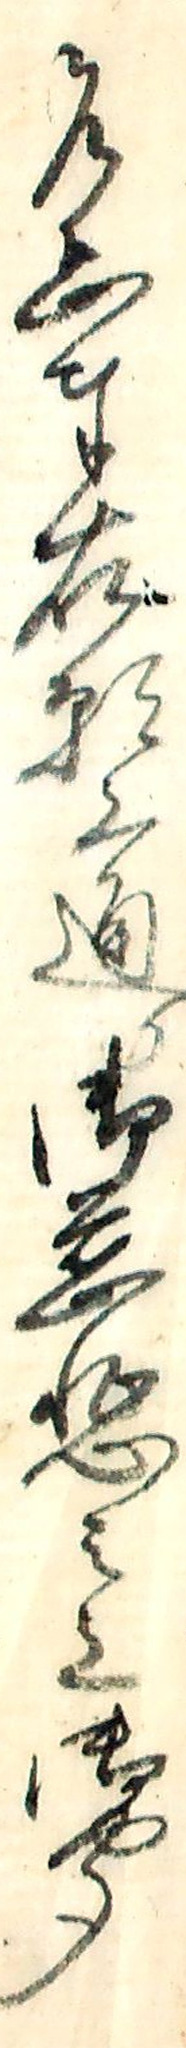乍恐奉右願上通り御慈悲之上御聞
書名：諸御願書控(後藤氏壱番）
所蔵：鳴門教育大学 Naruto University of Education
